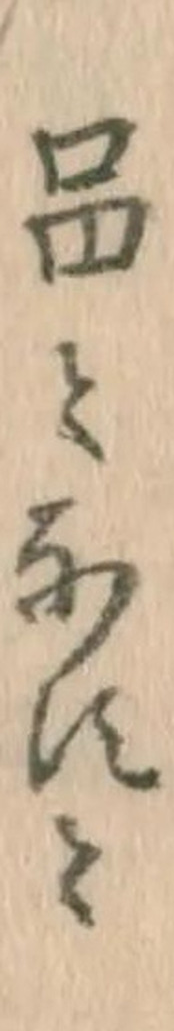品となすと
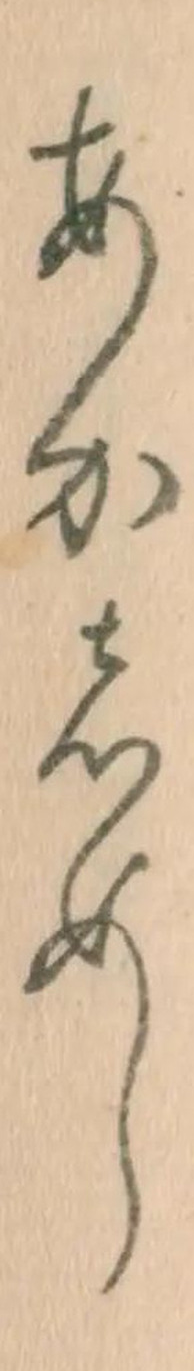あかしめし
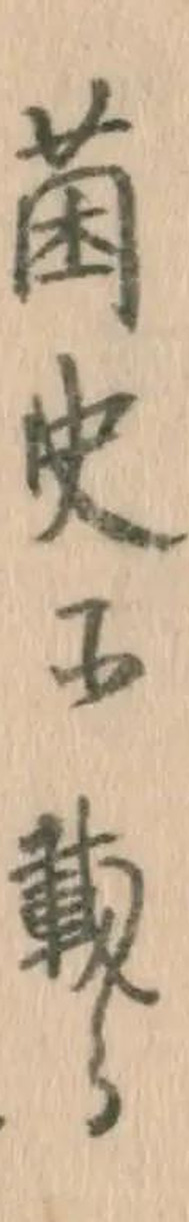菌史に載る
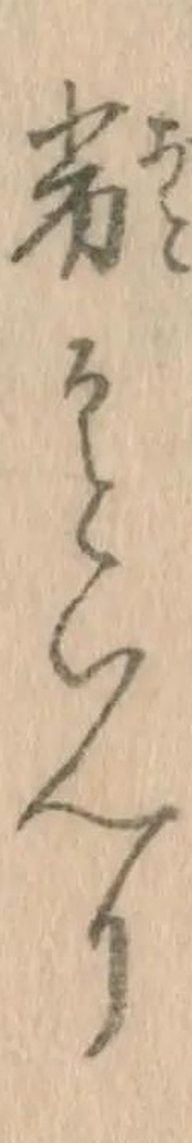劣るといへり

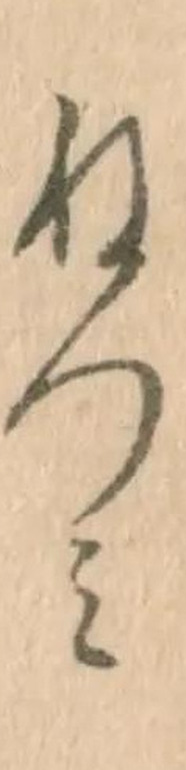ねつみ
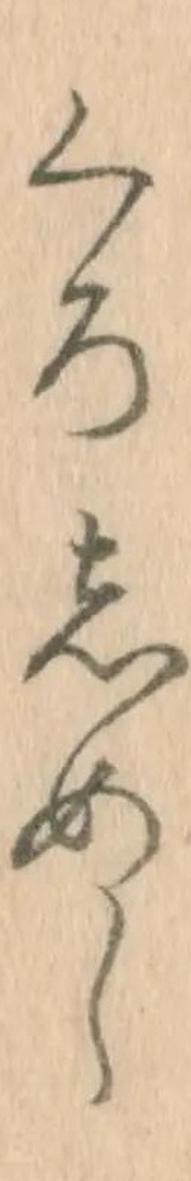くろしめし
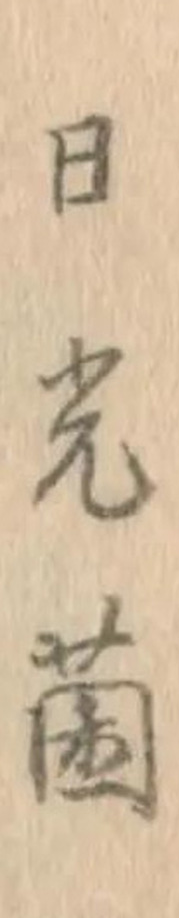日光菌
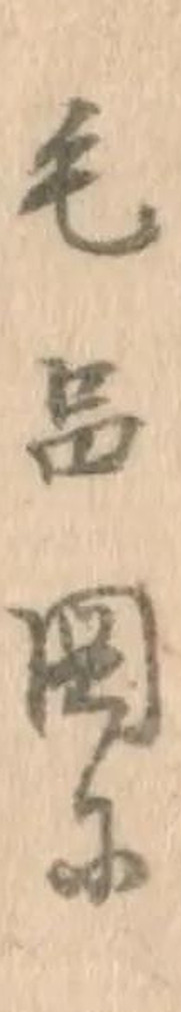毛品図に
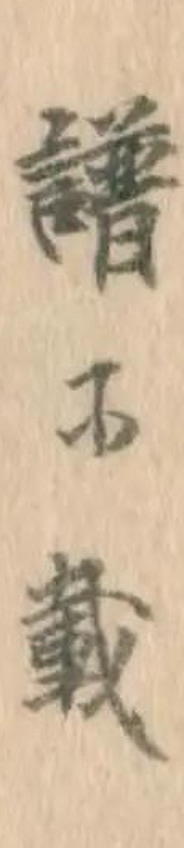譜に載
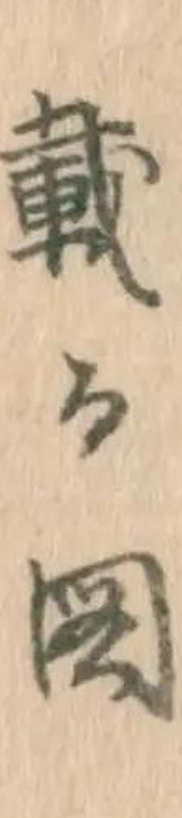載る図
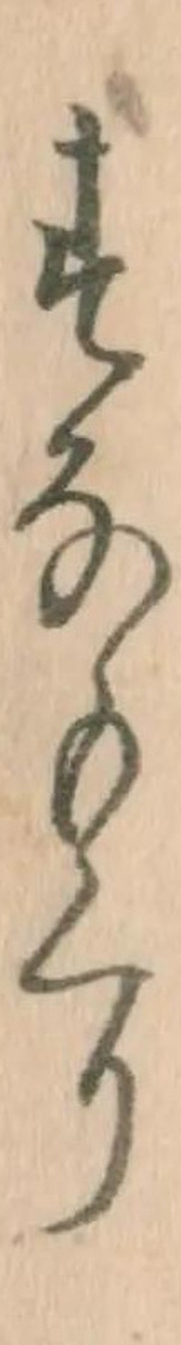すなもくり
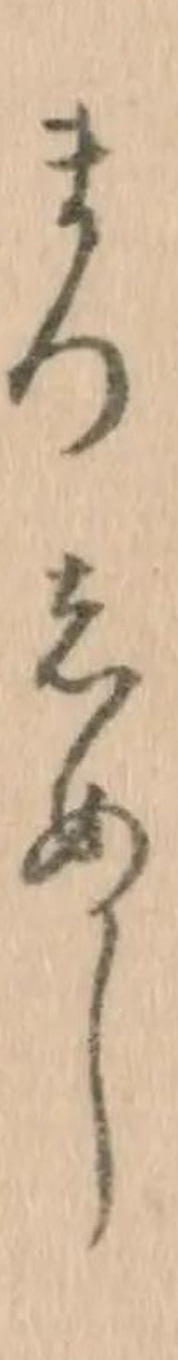まつしめし
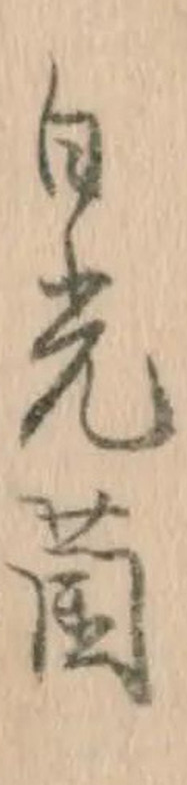日光菌
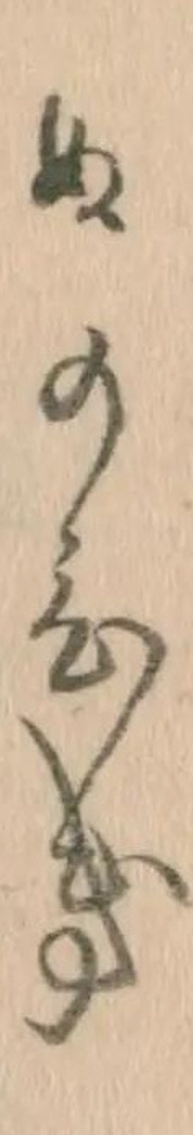ぬのひき
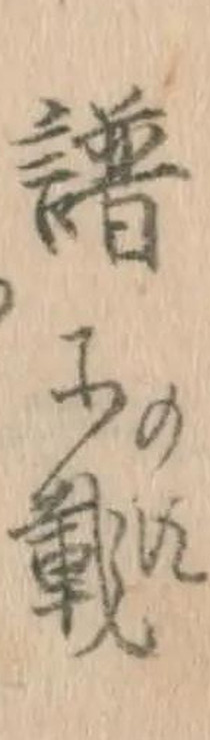譜に載
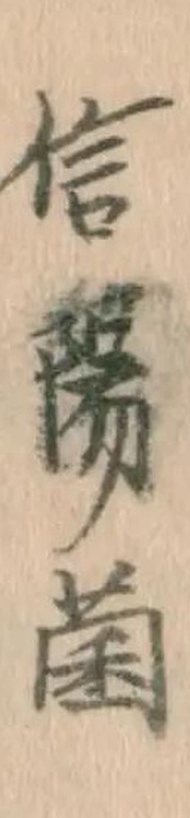信陽菌
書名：本草図譜. 巻55-57
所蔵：国立国会図書館 National Diet Library, JAPAN
